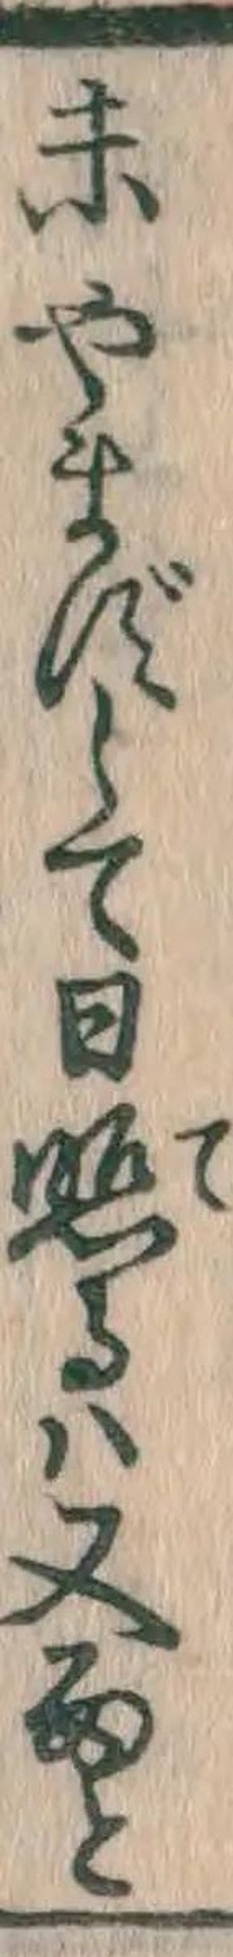未やまずして日照るは又雨と
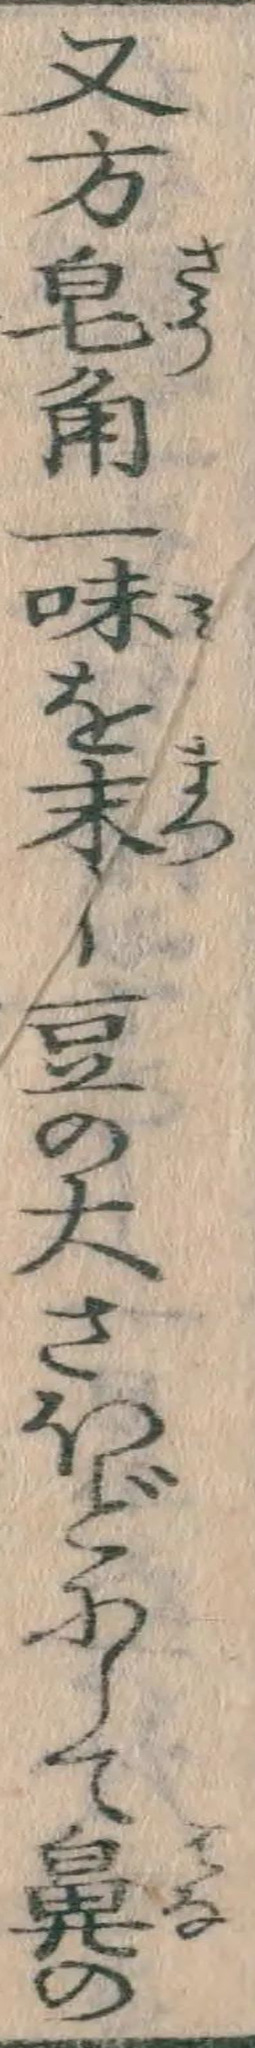又方皂角一味を末し豆の大さほどにして鼻の
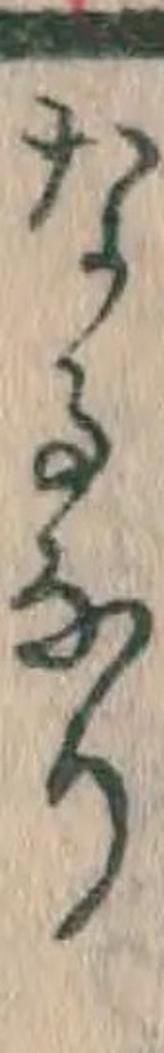なるなり
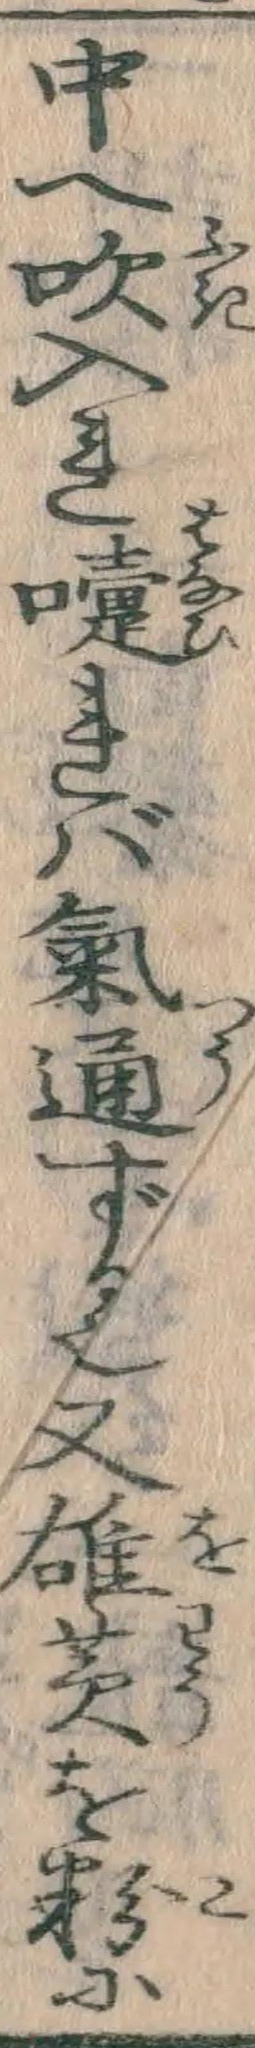中へ吹入れ嚔れば気通ずる也又雄黄を粉に
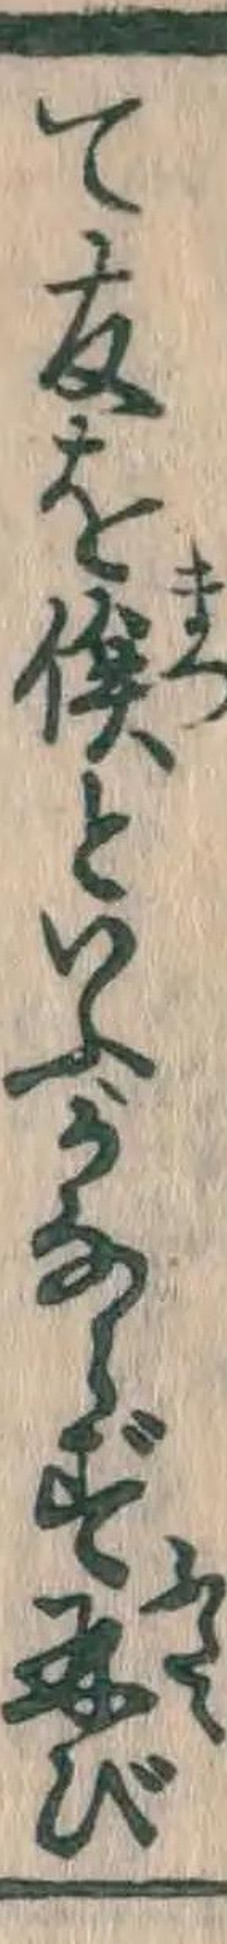て友を俟といふかならず再び
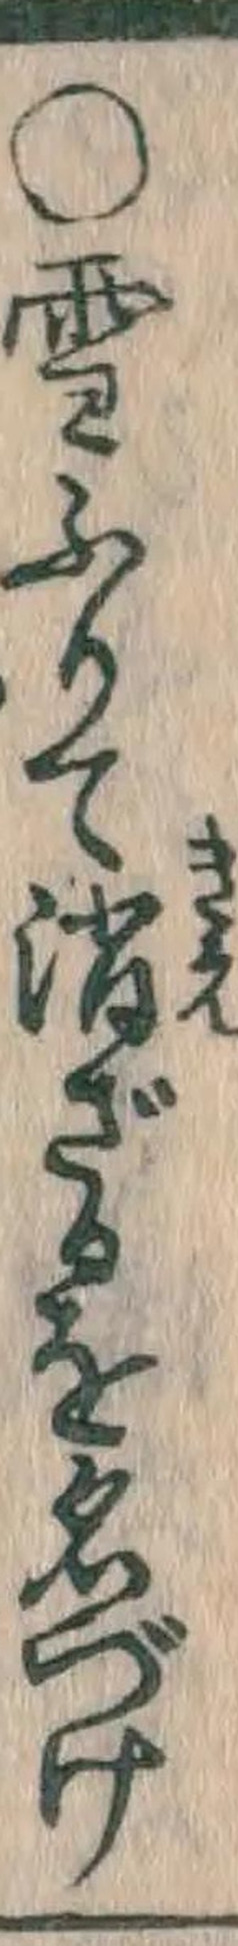○雪ふりて消ざるを名づけ
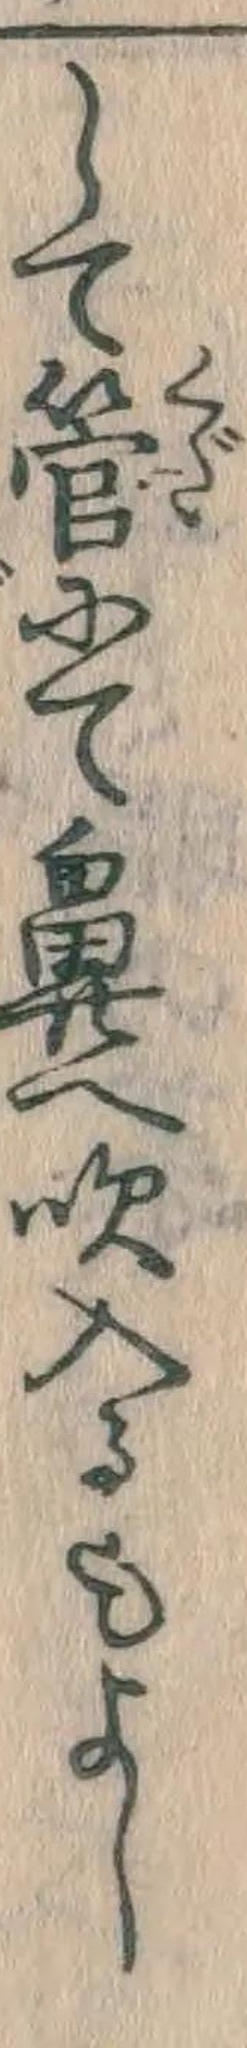して管にて鼻へ吹入るもよし
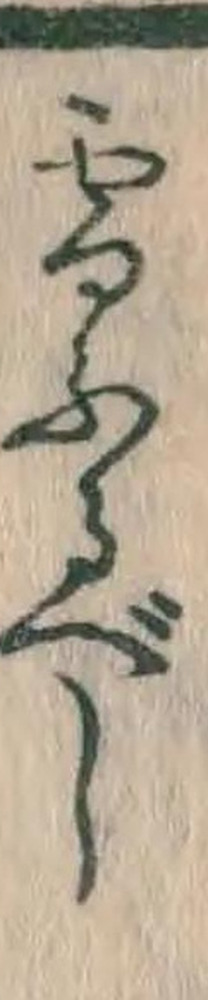雪ふるべし
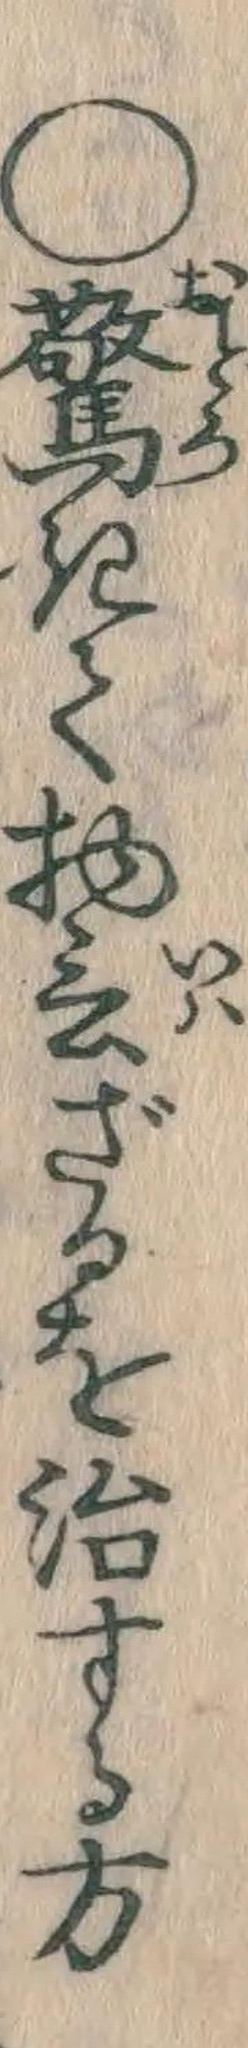○驚きて物云ざるを治する方
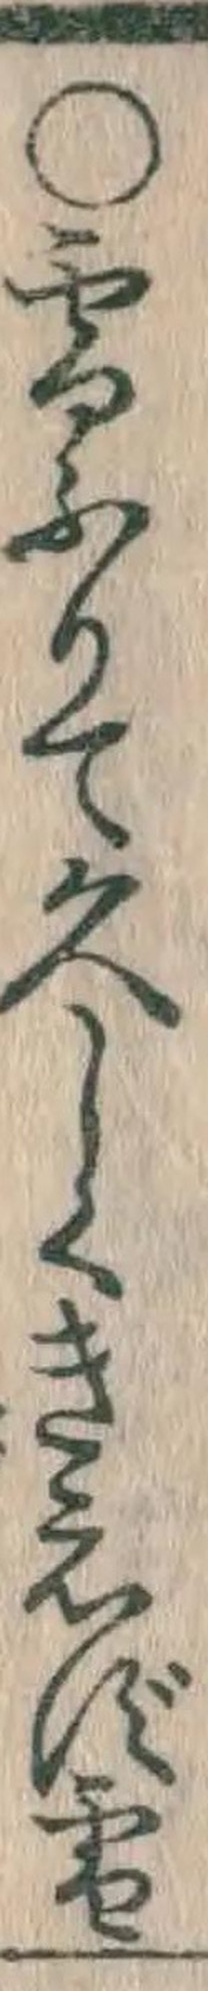○雪ふりて久しくきえず雪
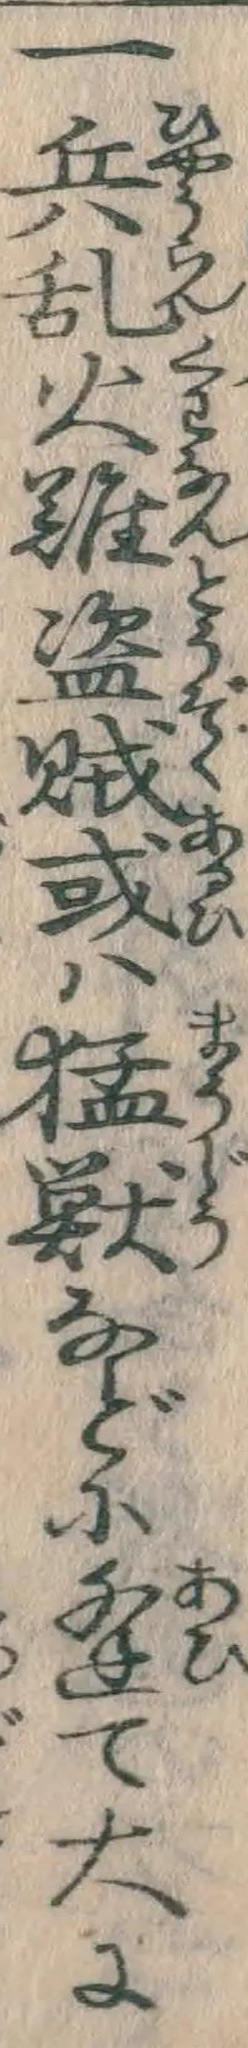一兵乱火難盗賊或は猛獣などに逢て大に
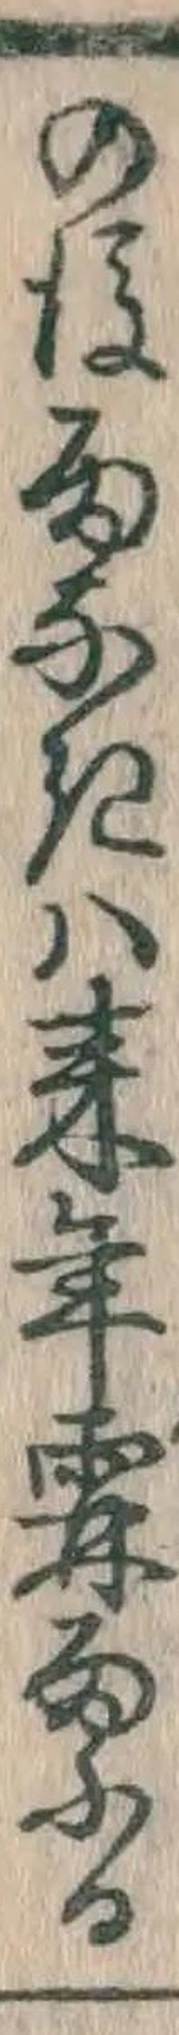の後雨なきは来年霖雨ふる
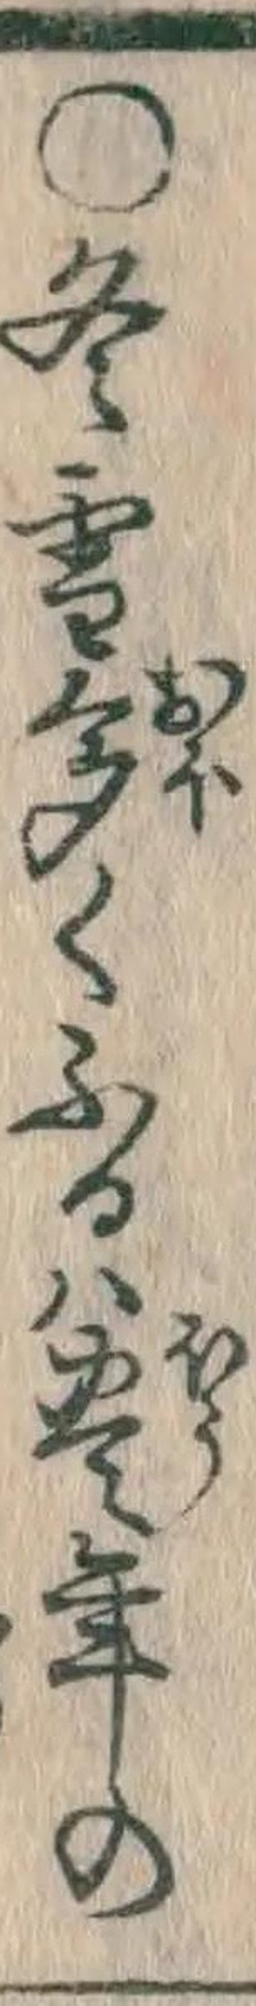○冬雪多くふるは豊年の
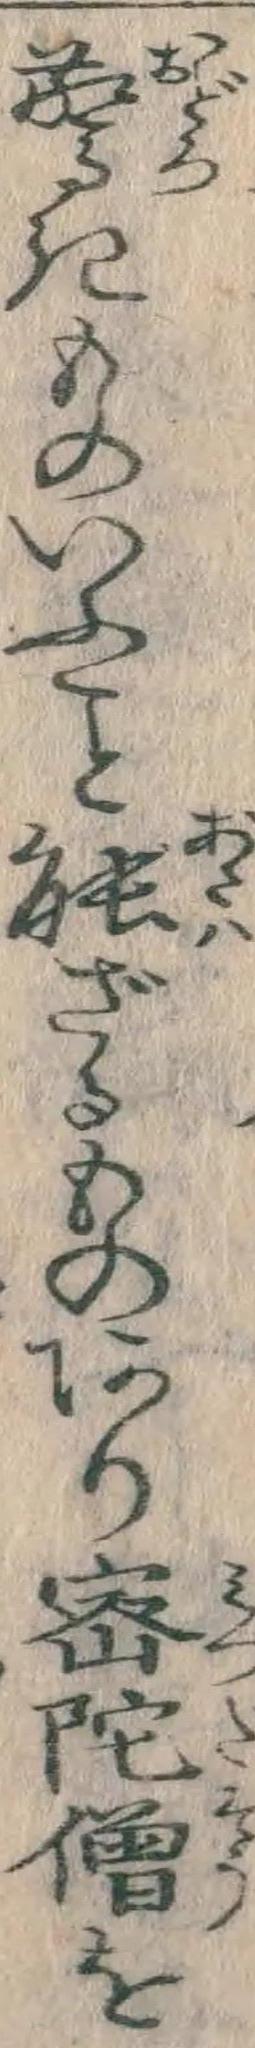驚きものいふこと能ざるものあり密陀僧を
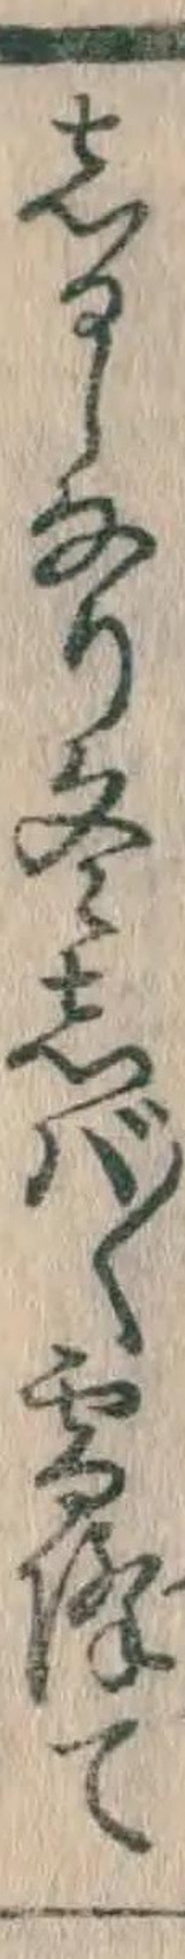しるしなり冬しば〳〵雪降て
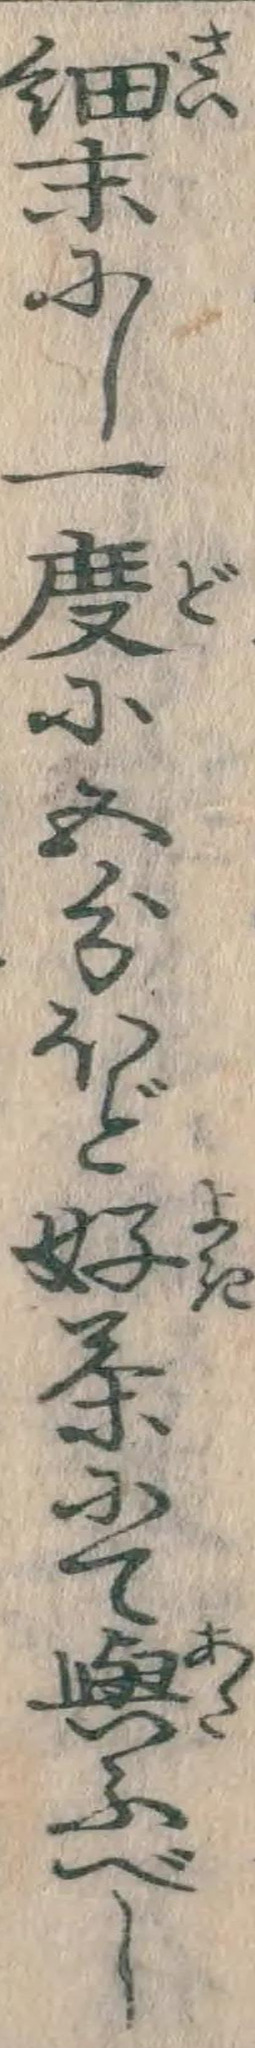細末にし一度に五分ほど好茶にて与ふべし
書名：広益秘事大全 3巻. [4]
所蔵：国立国会図書館 National Diet Library, JAPAN
